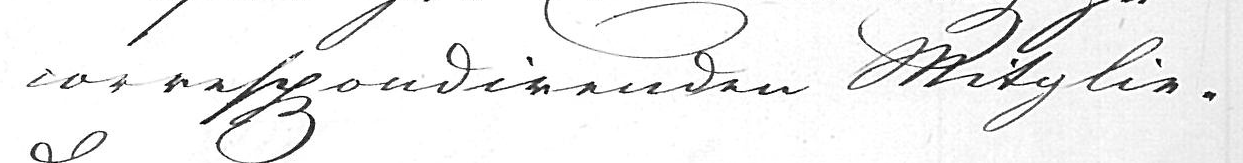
correspondirenden Mitglie-
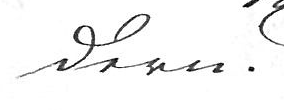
dern.
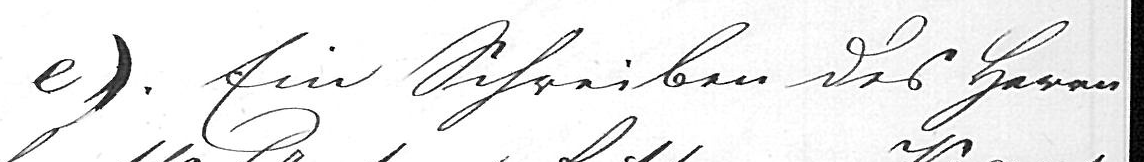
e). Ein Schreiben des Herrn
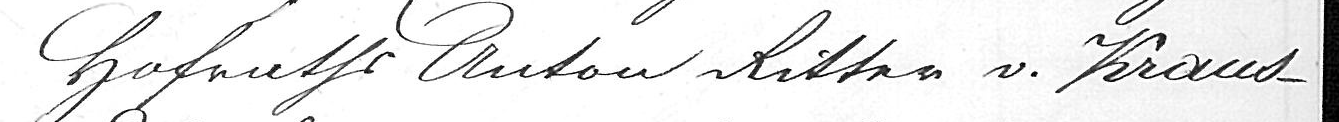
Hofraths Anton Ritter v. Kraus-
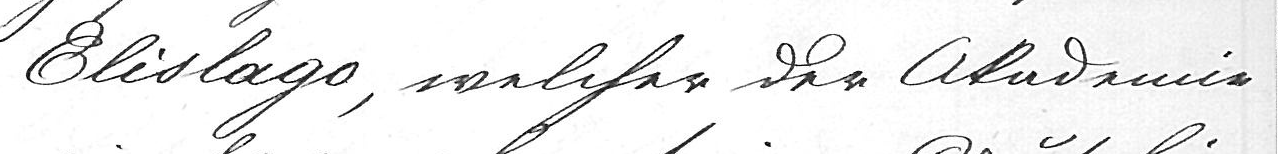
Elislago, welcher der Akademie
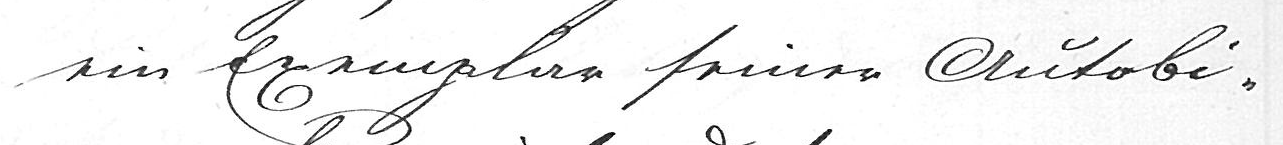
ein Exemplar seiner Autobi-
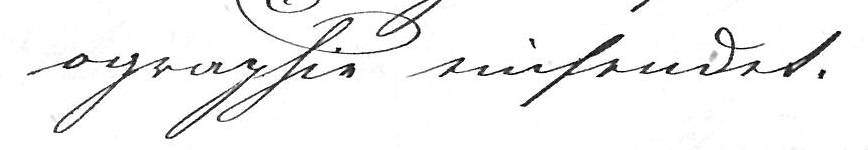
ographie einsendet.
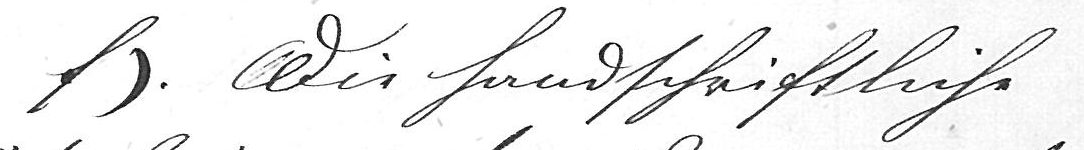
f). Die handschriftliche
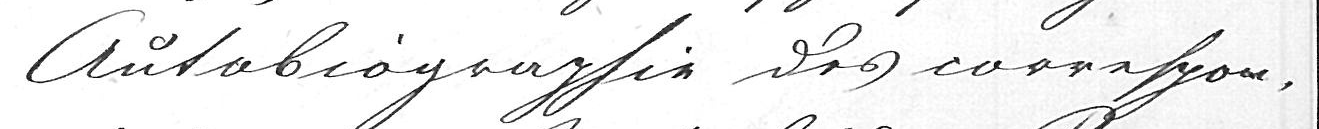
Autobiographie des correspon-
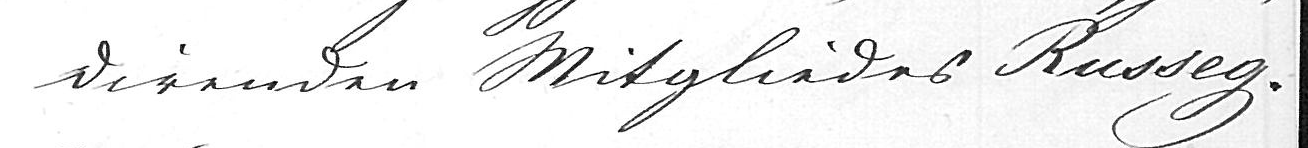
direnden Mitgliedes Russeg-
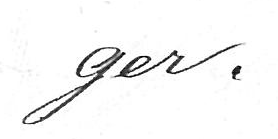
ger.
